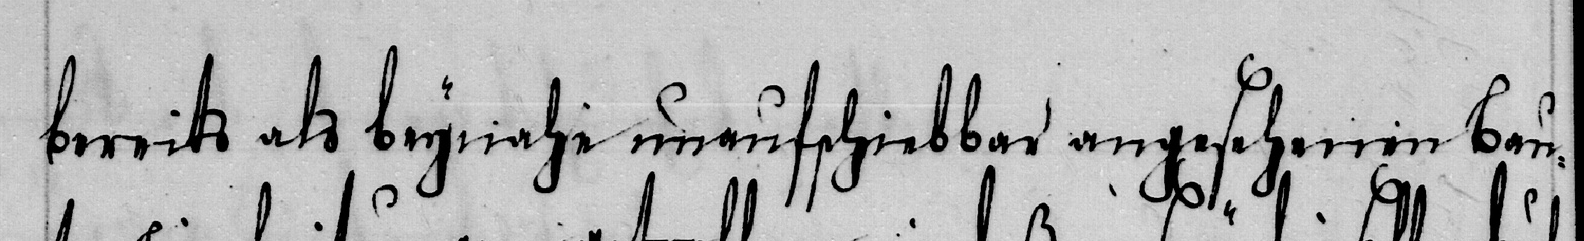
bereits als beynahe unaufschiebbar angesehenen Bau¬
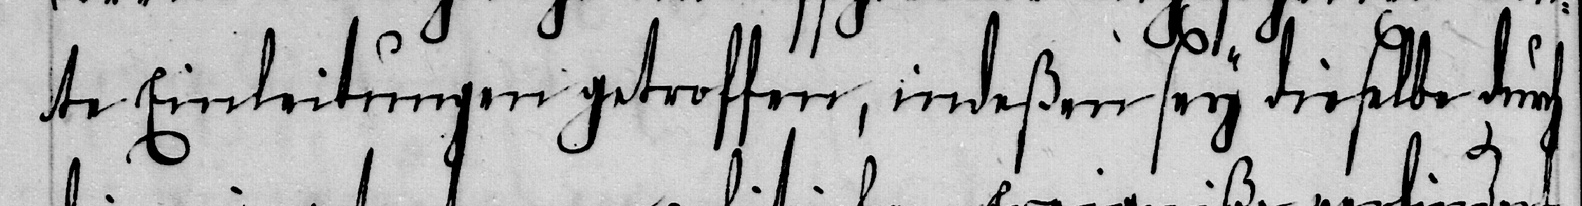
te Einleitungen getroffen, indeßen sey dieselbe durch
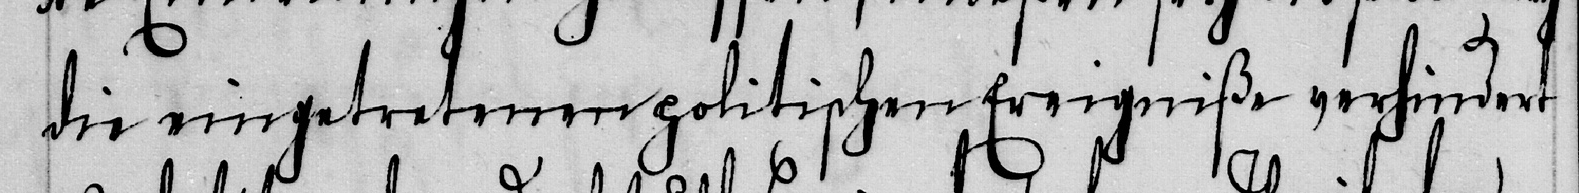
die eingetretenen politischen Ereigniße verhindert
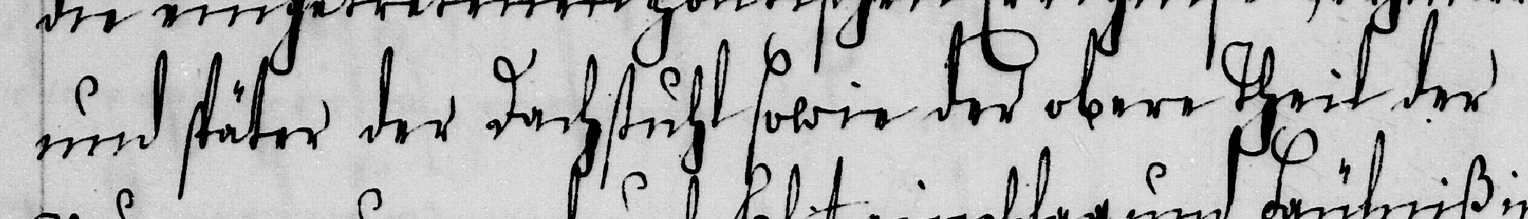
und später der Dachstuhl sowie der obere Theil der
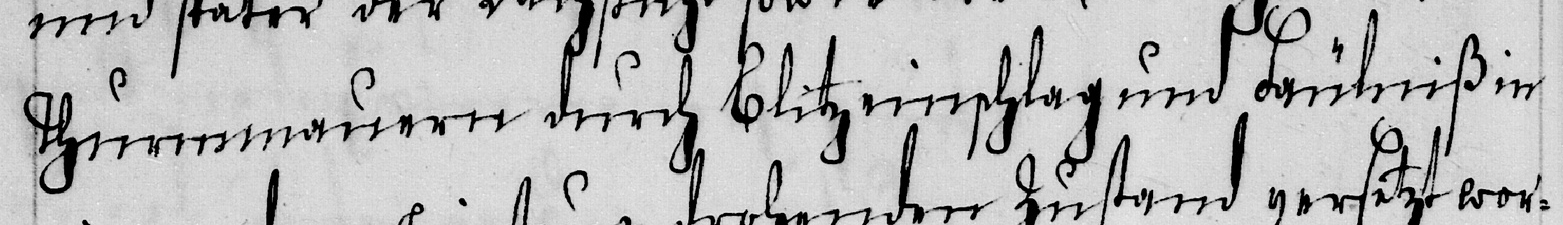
Thurmmauern durch Blitzeinschlag und Fäulniß in
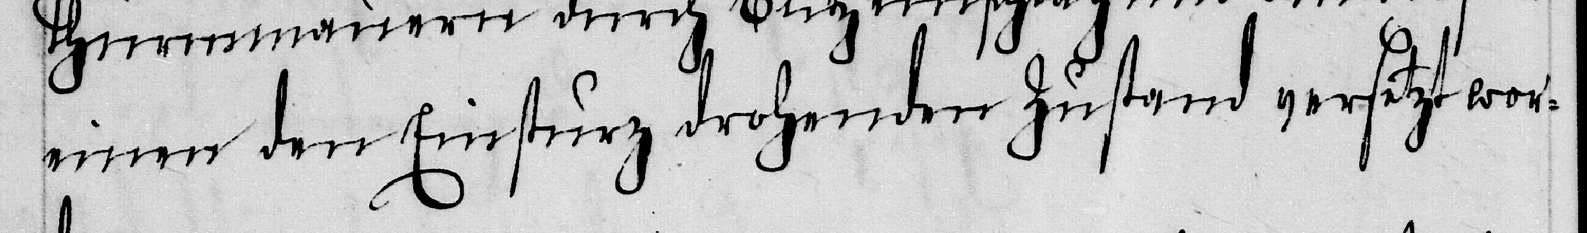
einen den Einsturz drohenden Zustand versertzt wor¬
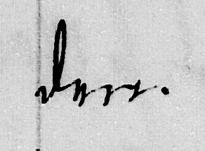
den.
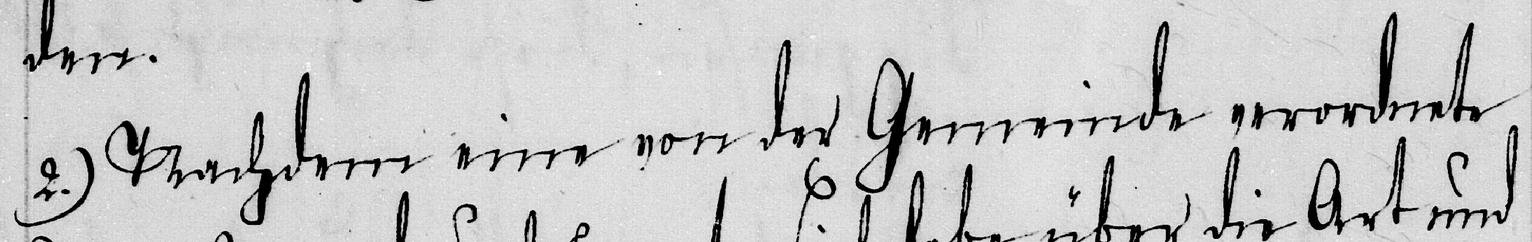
2.) Nachdem eine von der Gemeinde verordnete
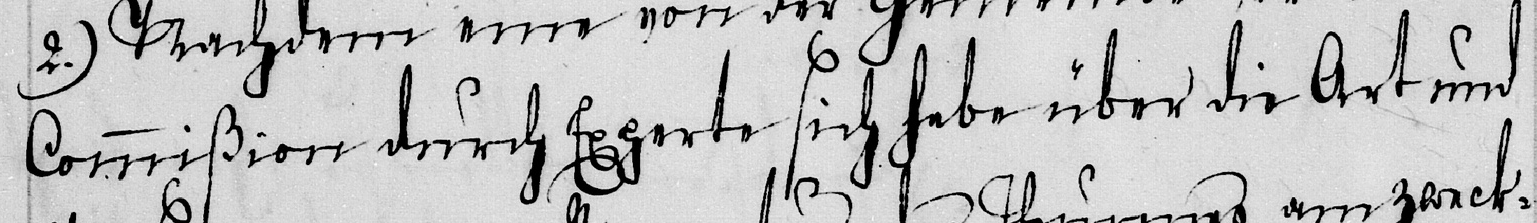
Commißion durch Experte sich habe über die Art und
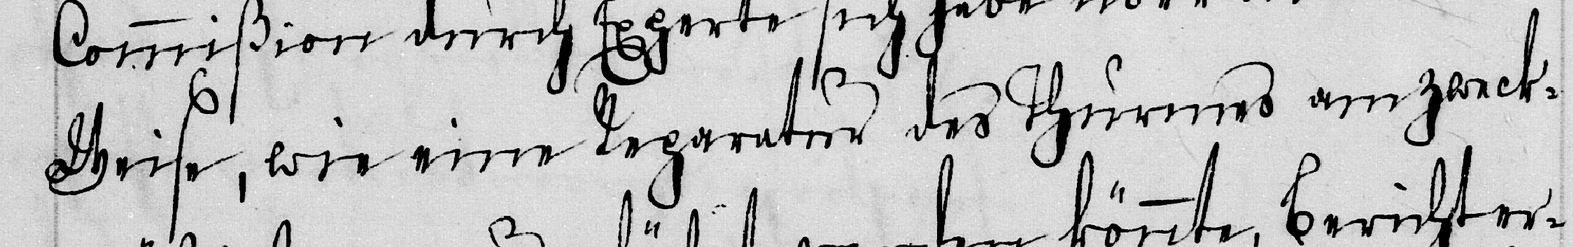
Weise, wie eine Reparatur des Thurmes am zweck¬
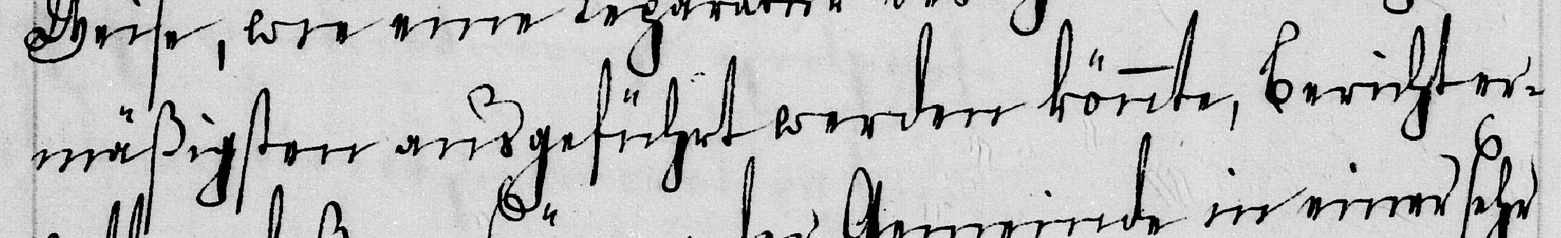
äßigsten ausgeführt werden könnte, Bericht er¬
